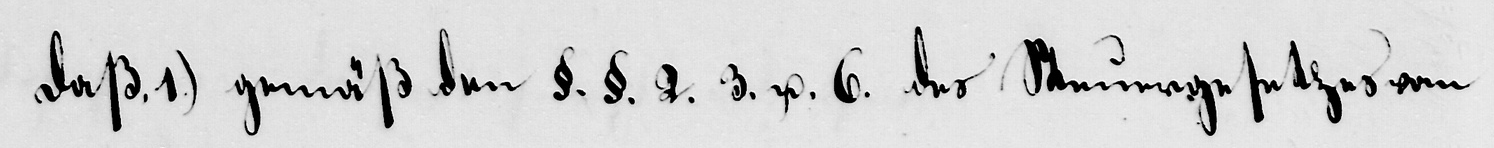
daß, 1.) gemäß den §. §. 2. 3. u. 6. des Steuergesetzes vom
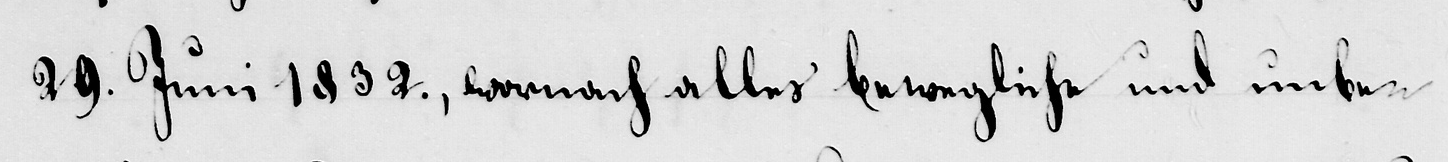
29. Juni 1832., wornach alles bewegliche und unbe¬
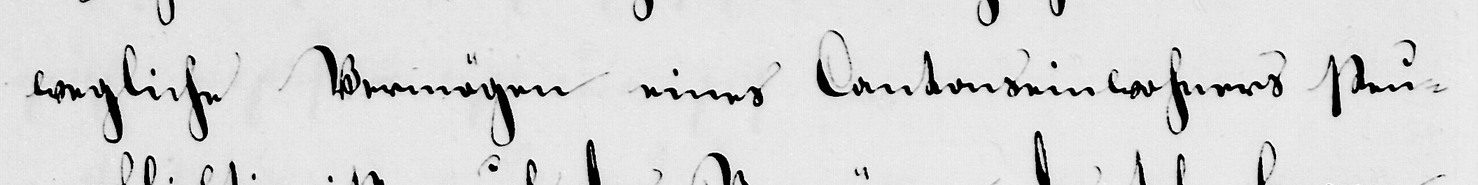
wegliche Vermögen eines Cantonseinwohners steu¬
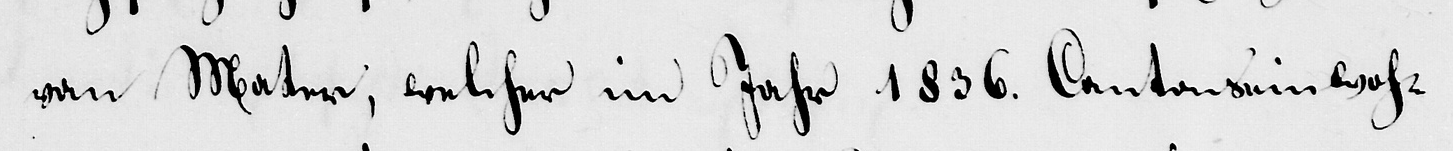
von Mater, welcher im Jahr 1836. Cantonseinwoh¬
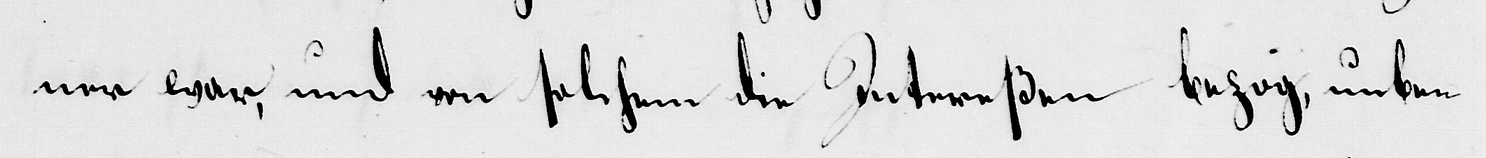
ner war, und von solchem die Intereßen bezog, unbe¬
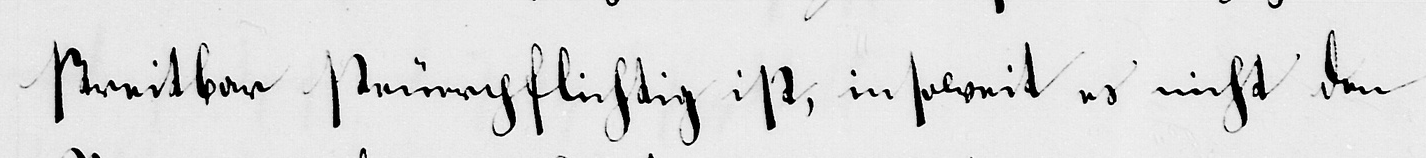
streitbar steuerpflichtig ist, insoweit es nicht den
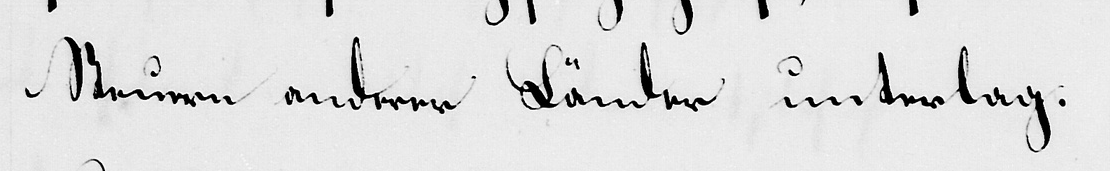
Steuern anderer Länder unterlag.
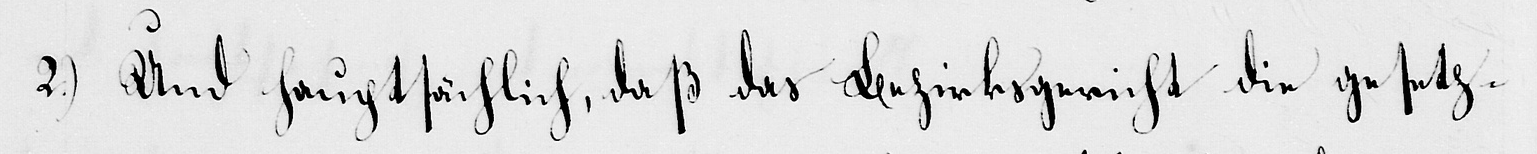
2.) Und hauptsächlich, daß das Bezirksgericht die gesetz¬
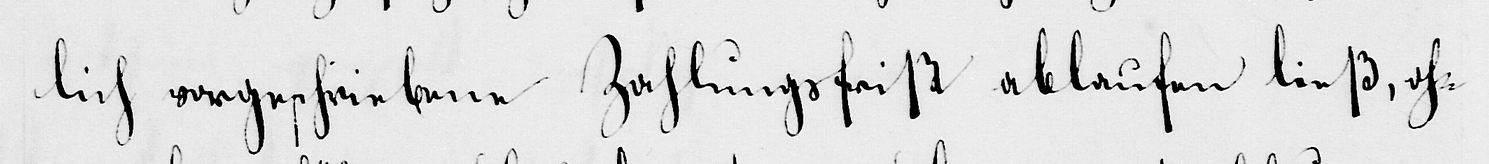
lich vorgeschriebene Zahlungsfrist ablaufen ließ, oh¬
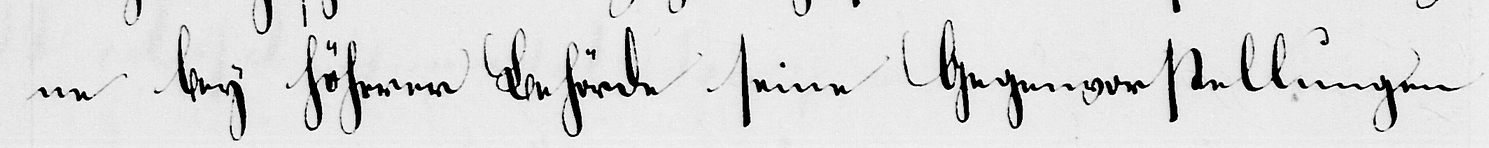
ne bey höherer Behörde seine Gegenvorstellungen
